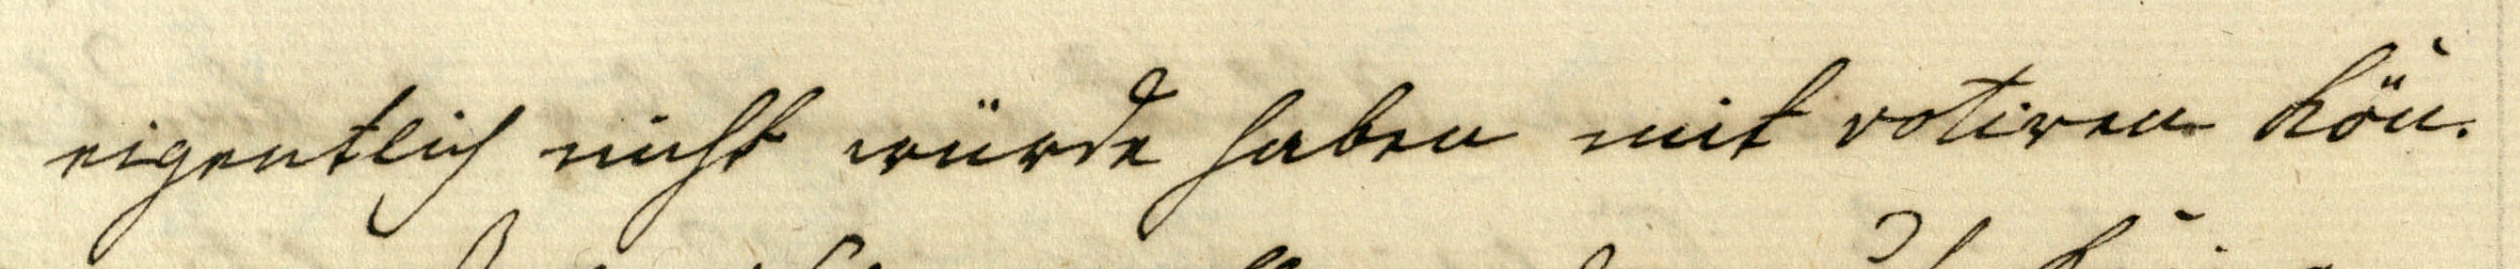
eigentlich nicht würde haben mit votiren kön-
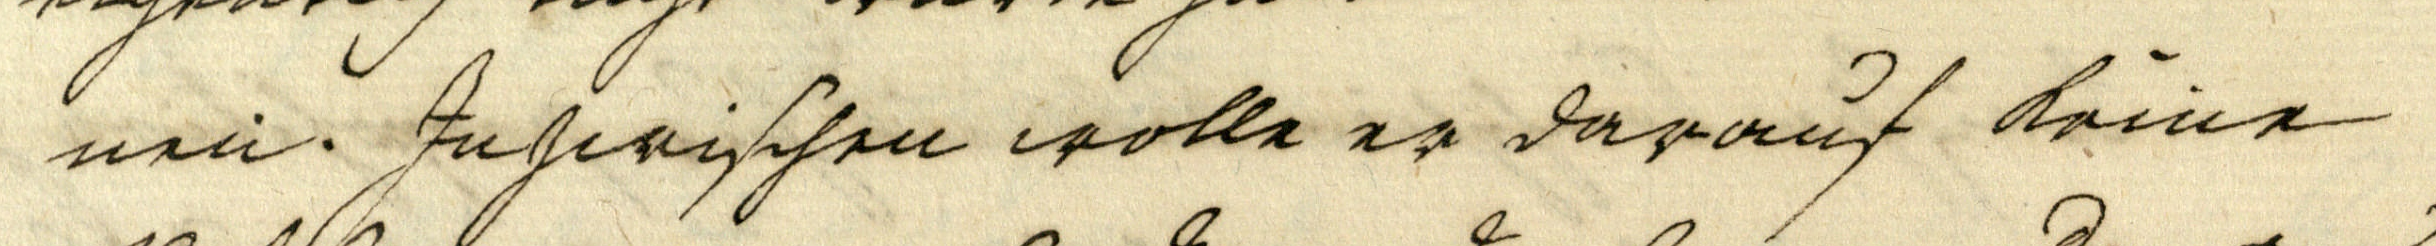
nen. Inzwischen wolle er darauf keine
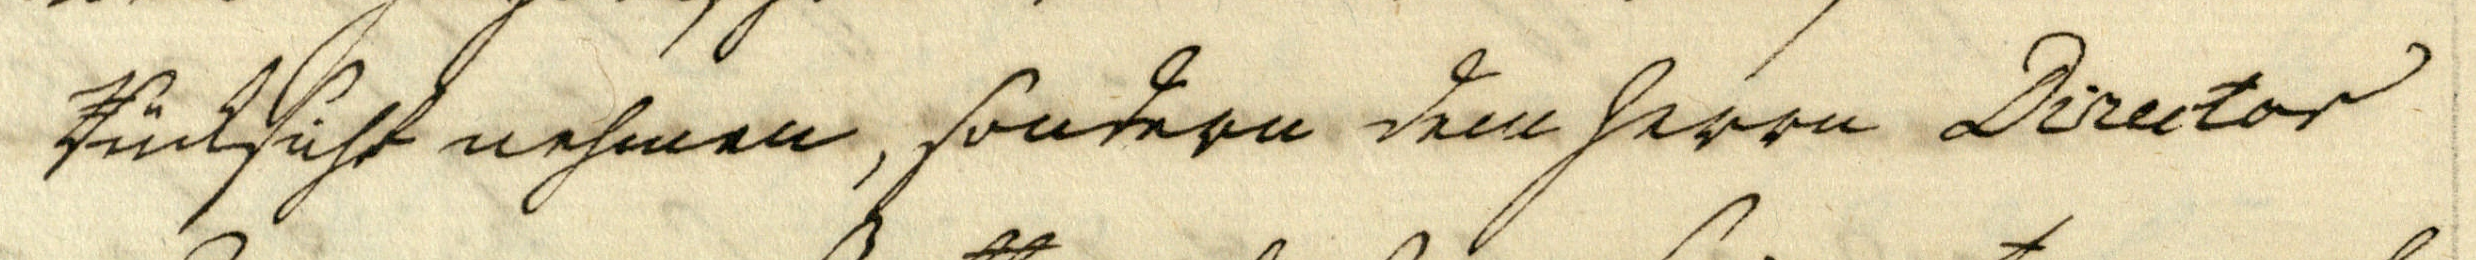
Rücksicht nehmen, sondern dem Herrn Director
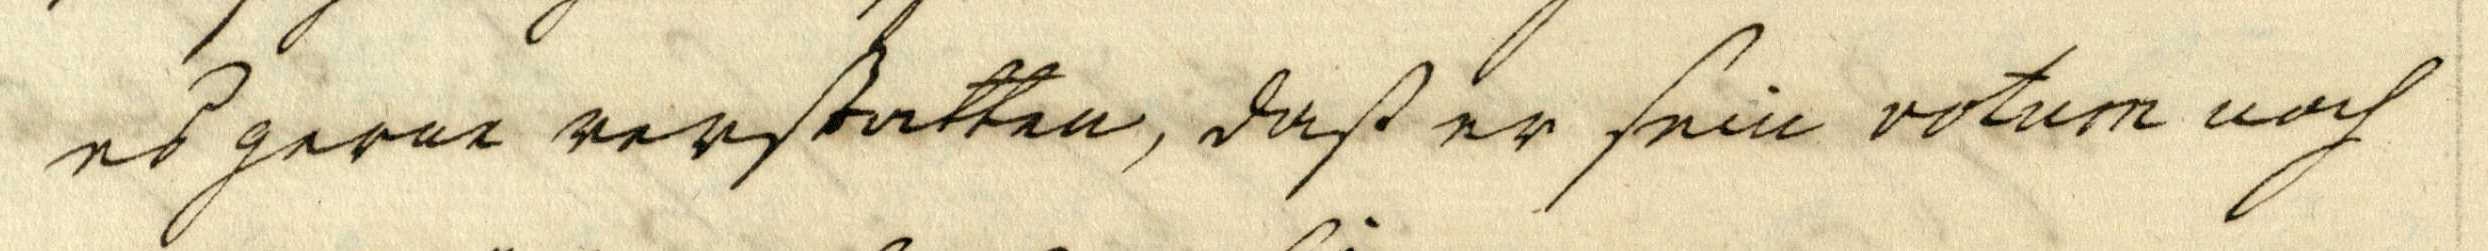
es gerne verstatten, daß er sein votum noch
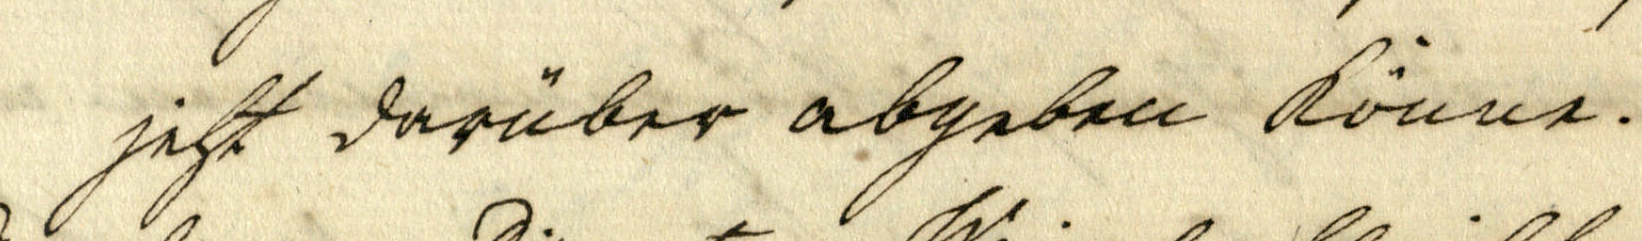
jetzt darüber abgeben könne.
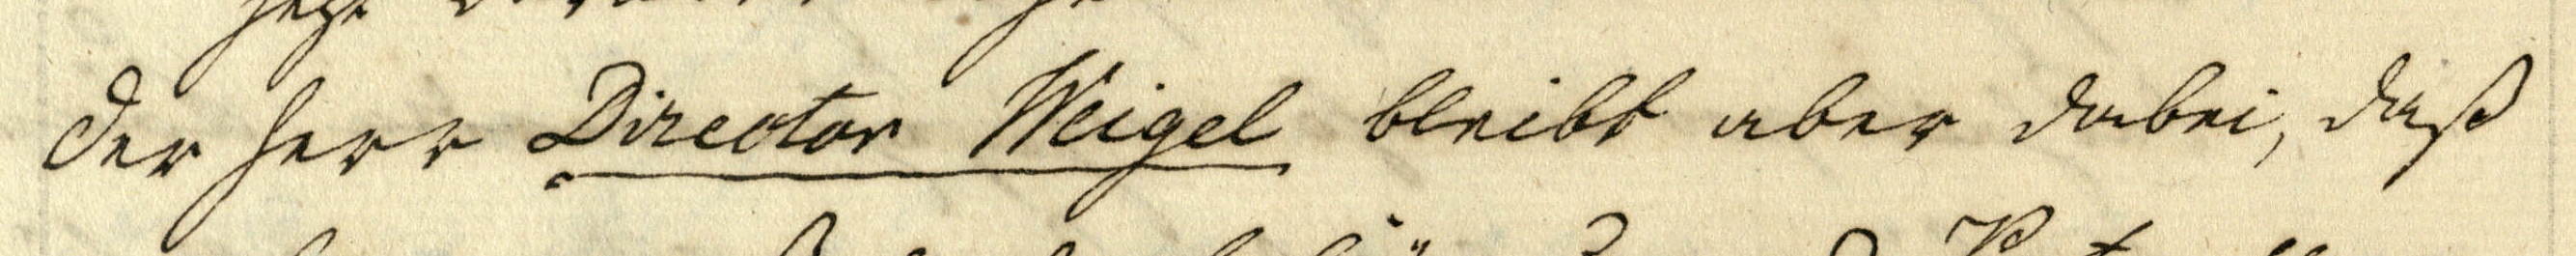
Der Herr Director Weigel bleibt aber dabei, daß
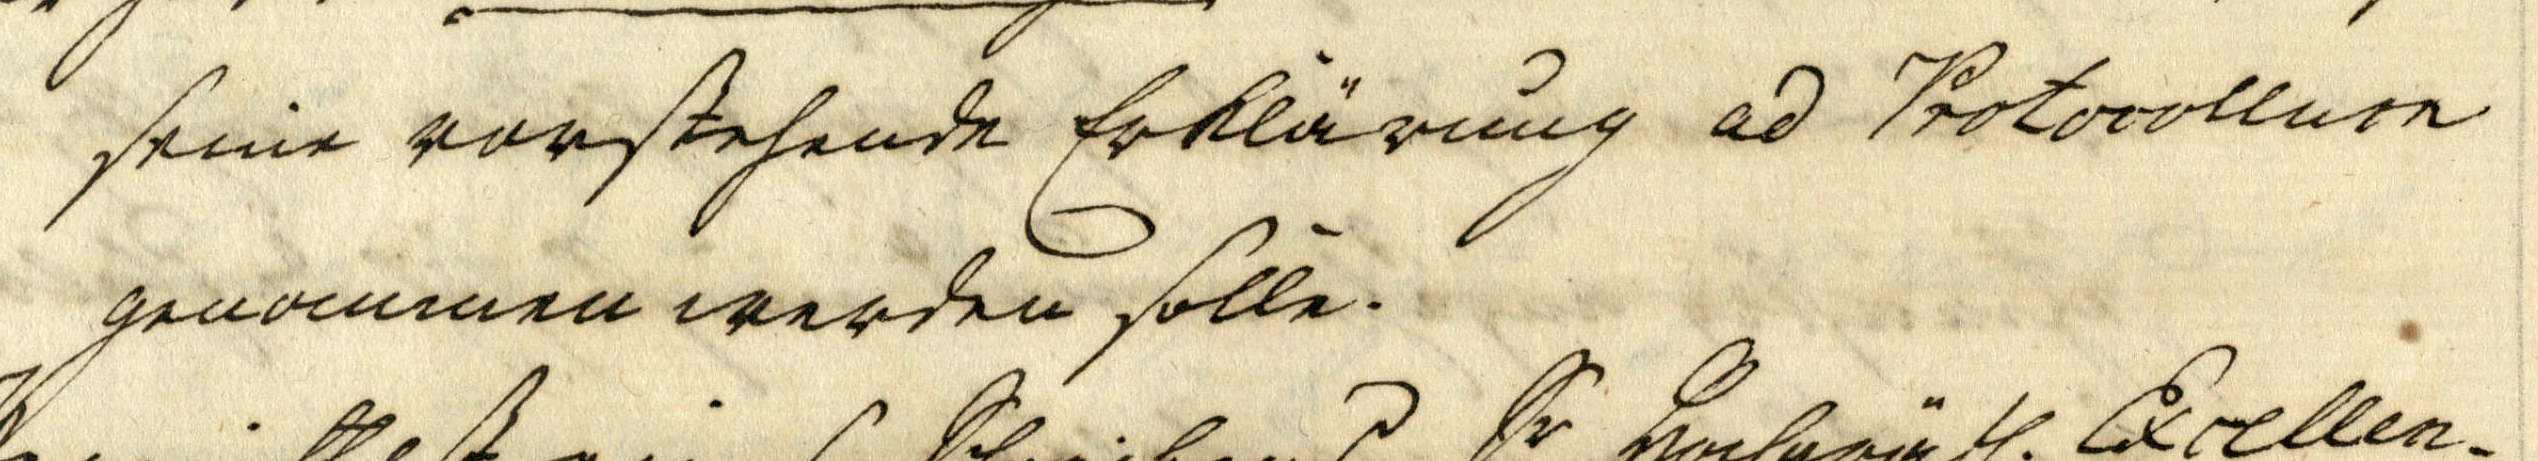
seine vorstehende Erklärung ad Protocollum
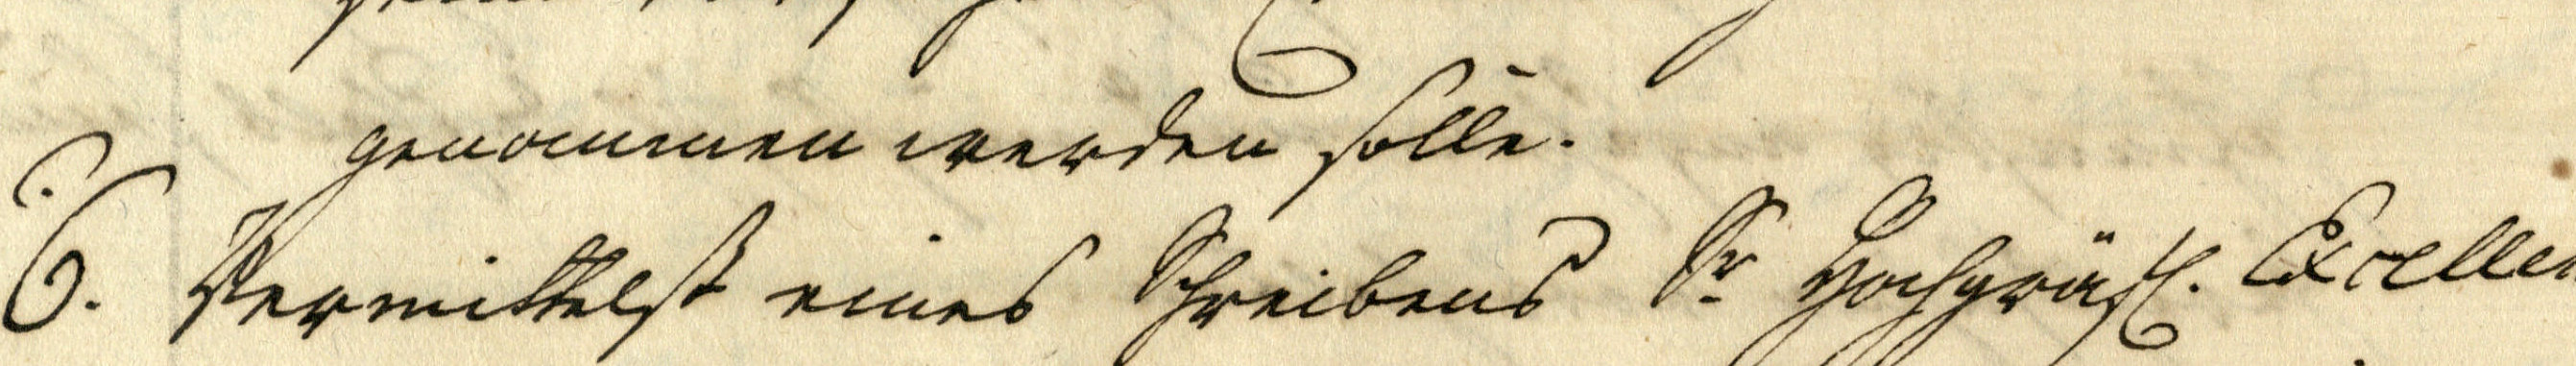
genommen werden solle
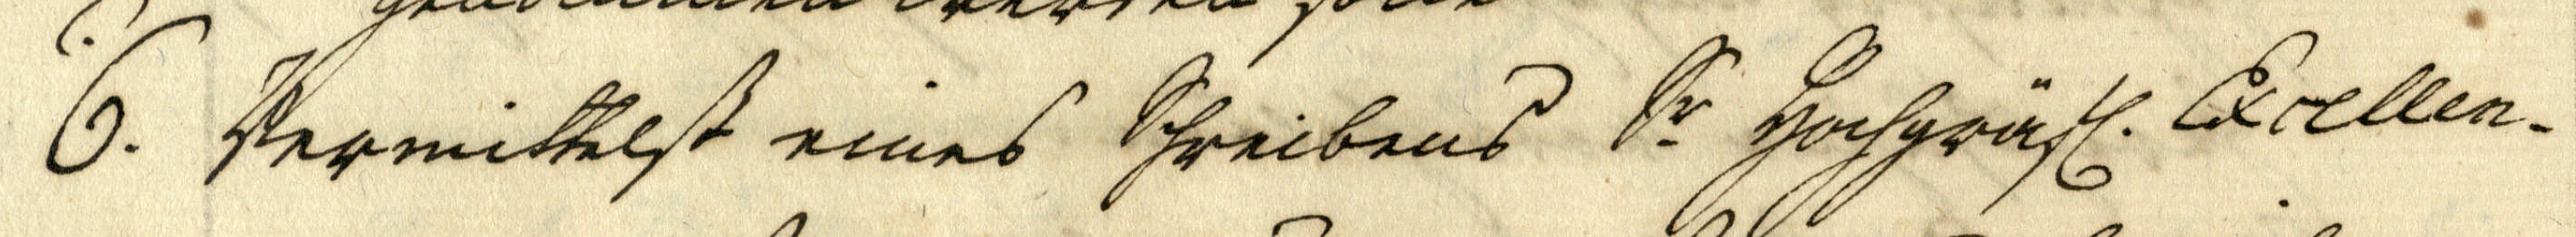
6. Vermittelst eines Schreibens Sr. hochgräfl. Excellen-
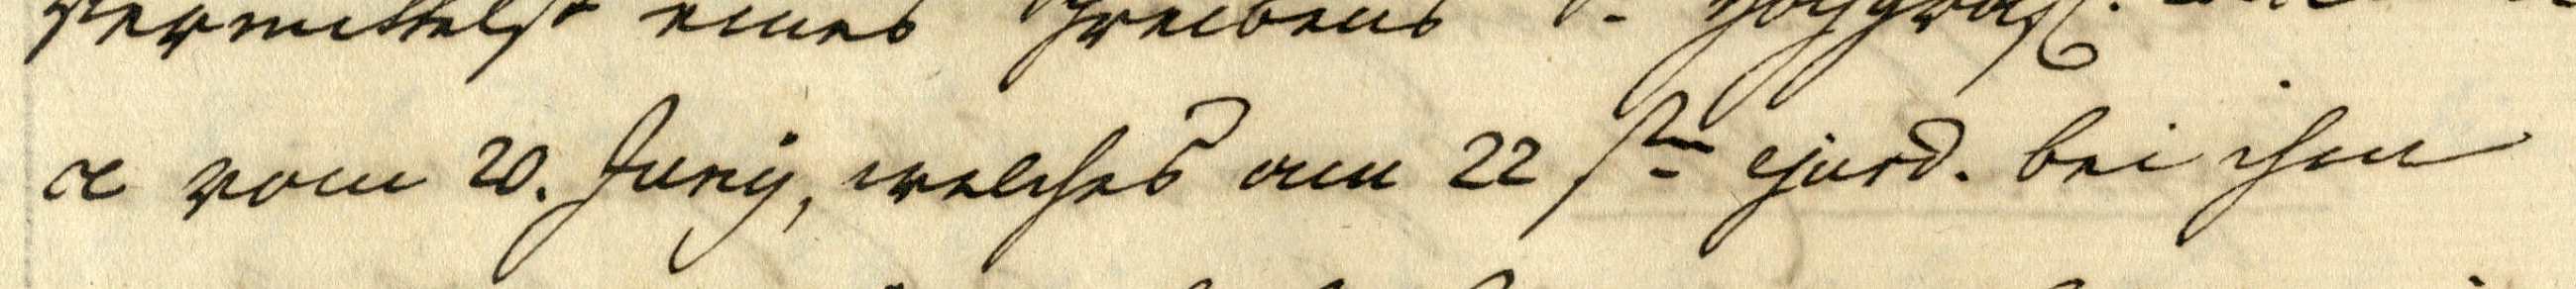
ce vom 20. Juny, welches am 22sten ejusd. bei ihm
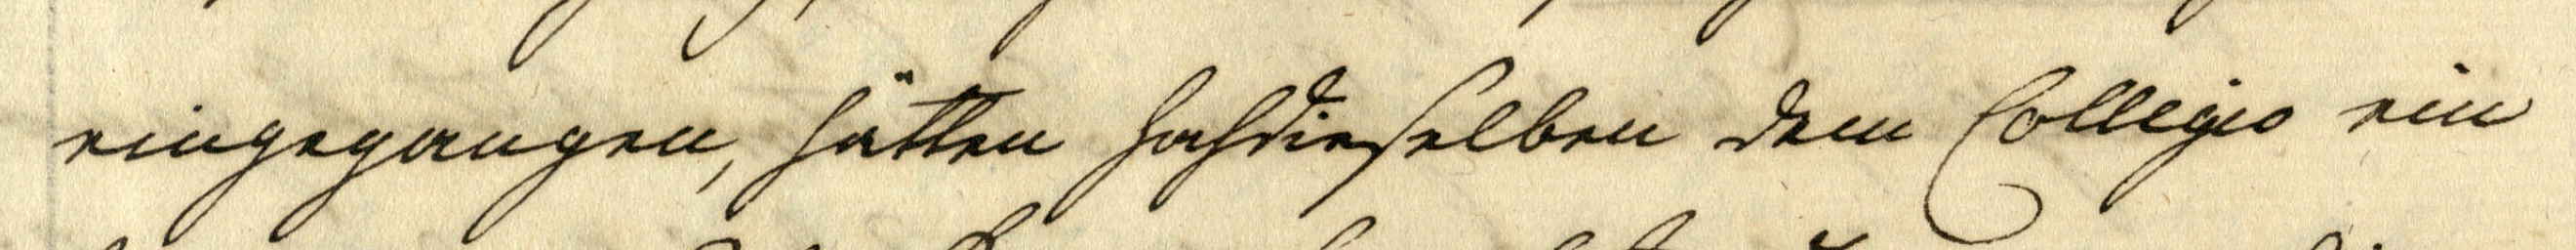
eingegangen, hätten hochdieselben dem Collegio ein
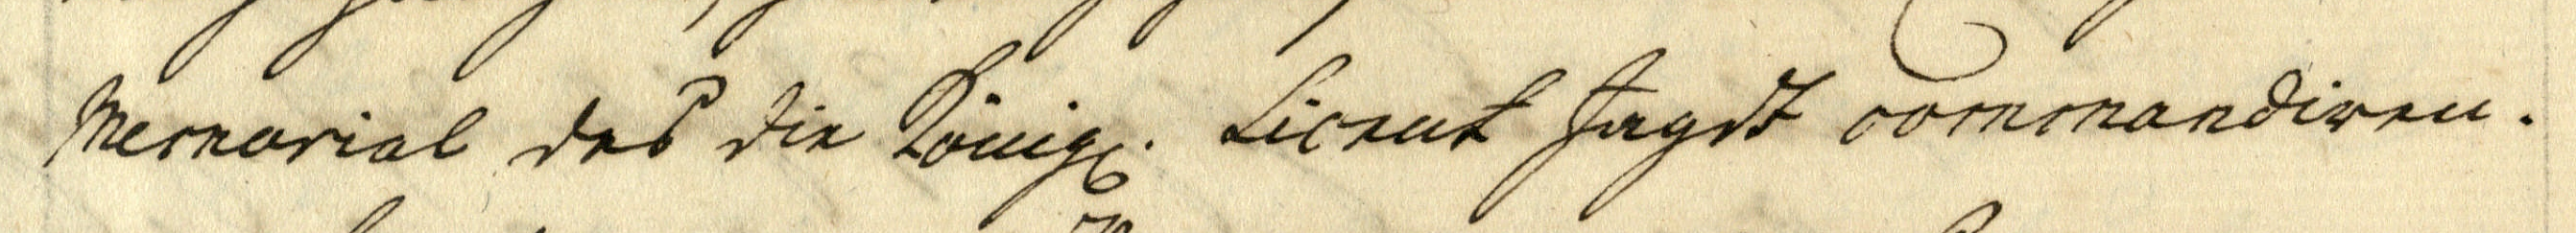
Memorial des die Königl. Licent Jagdt comandiren-
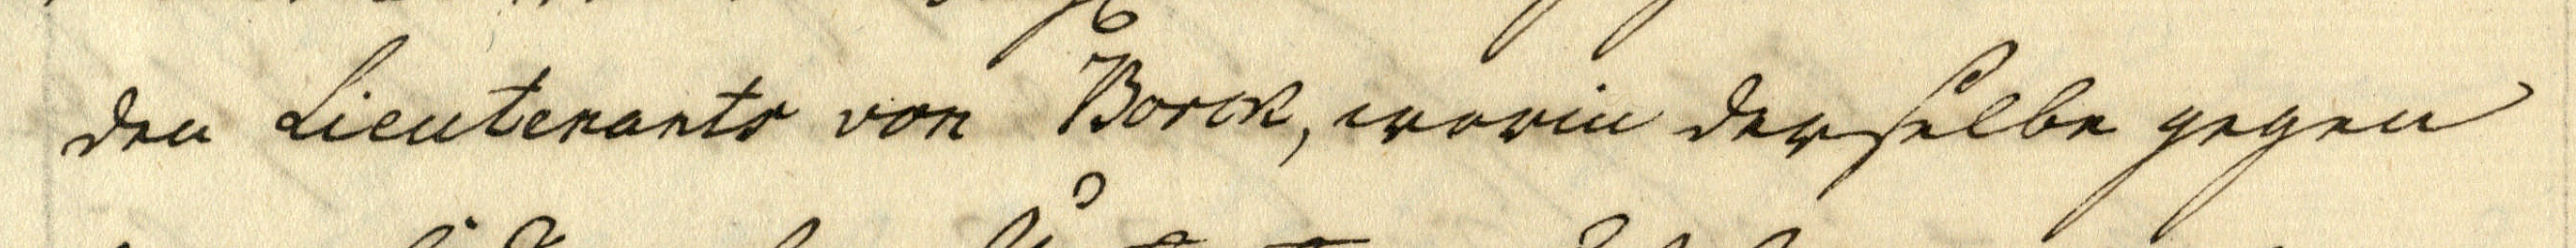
den Lieutenants von Borck, worin derselbe gegen
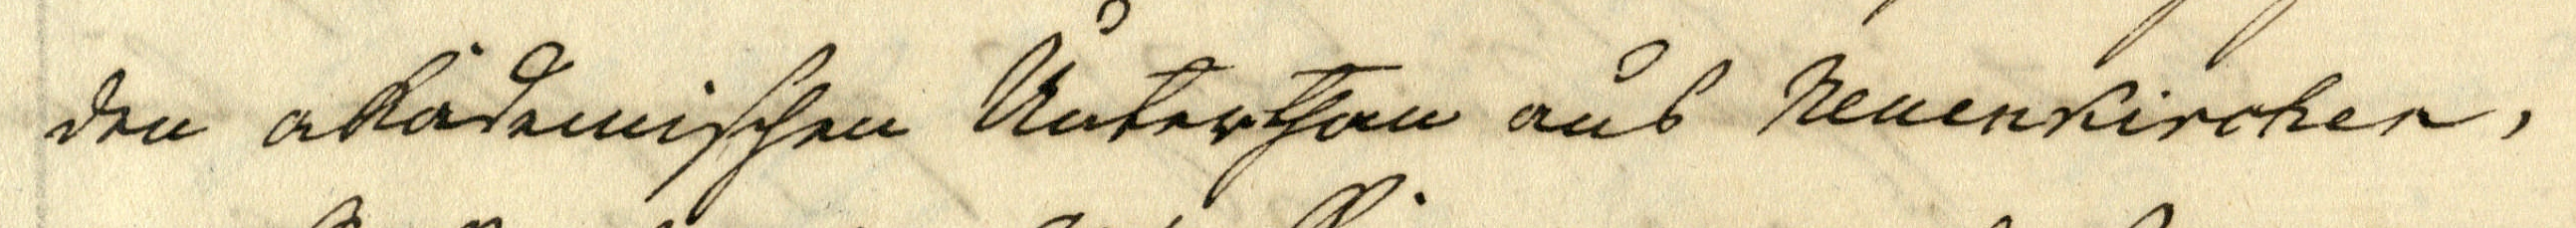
den akademischen Unterthan aus Neuenkirchen,
